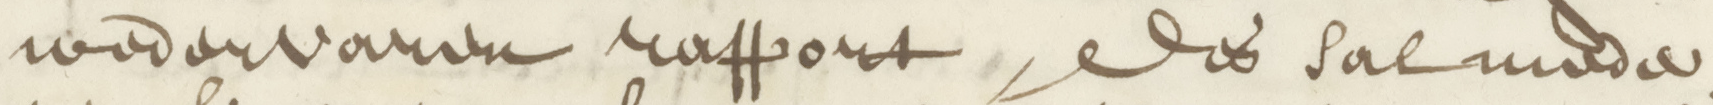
wedervaren rapport. Des sal mede
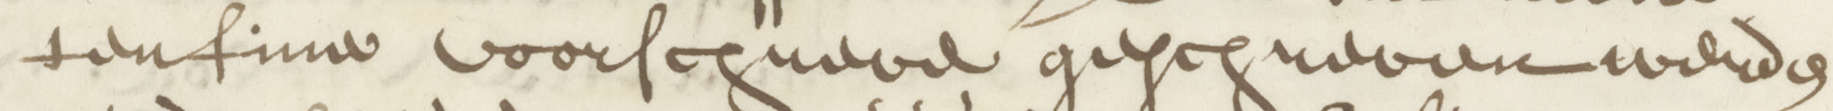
ten fine voorschreve geschreven werden
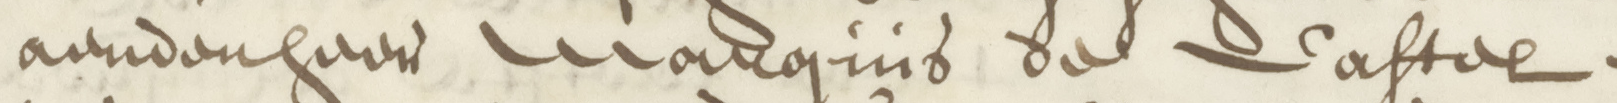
aenden heer Marquis de Castel
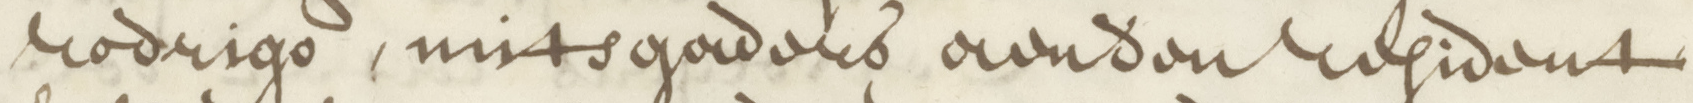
Rodrigo, mitsgaders aen den Resident
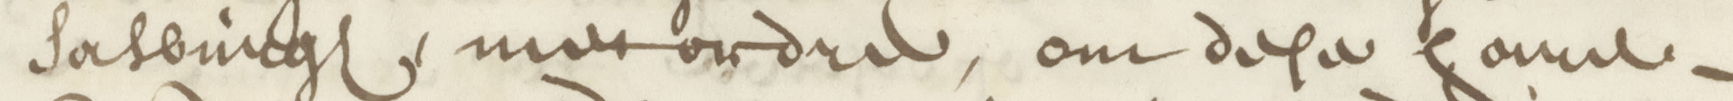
Sasburgh, met ordre, om dese hare
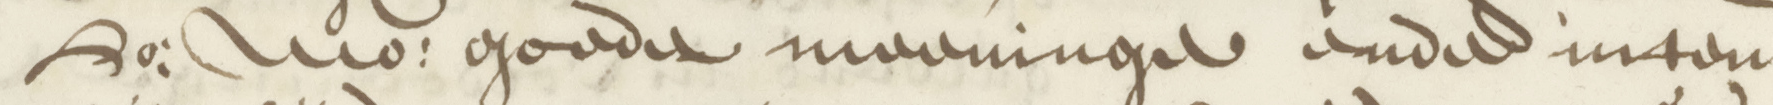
Ho:Mo: goede meeninge ende inten
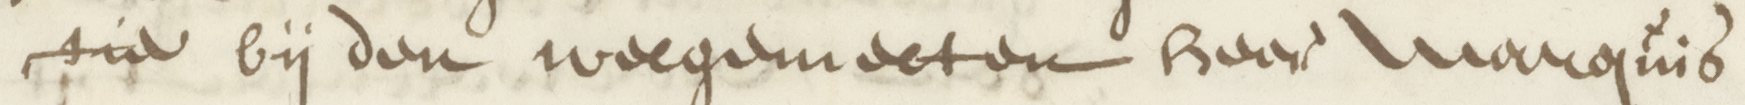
tie bij den welgemelten heer Marquis
